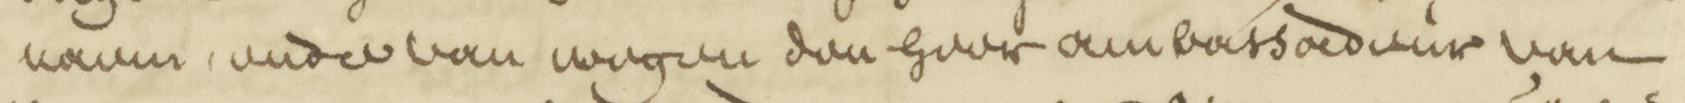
naem, ende van wegen den heer ambassadeur van
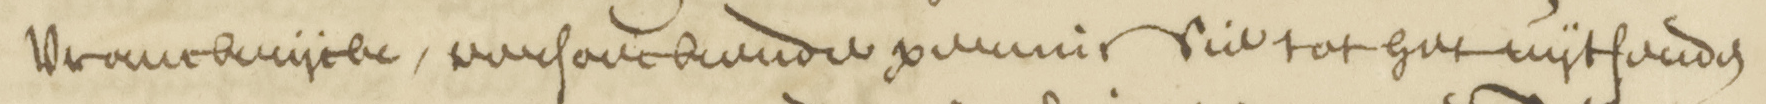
Vranckrijck, versoeckende permissie tot het uijtsenden
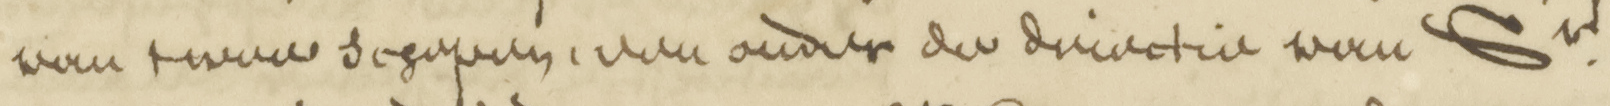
van twee schepen, een onder de directie van Sr
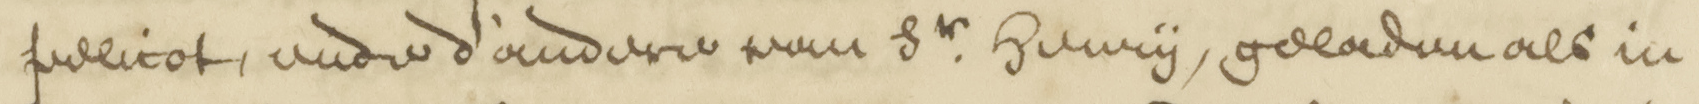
Pelicot, ende d'andere van Sr Henrij, geladen als in
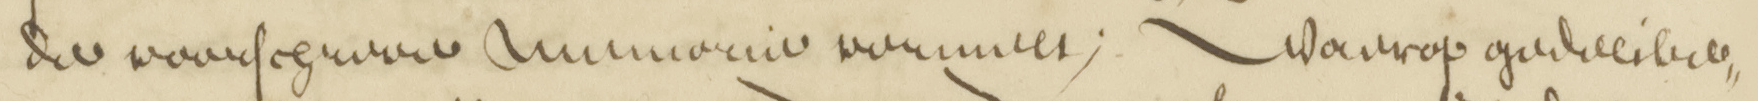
de voorschreve memorie vermelt; Waerop gedelibe„
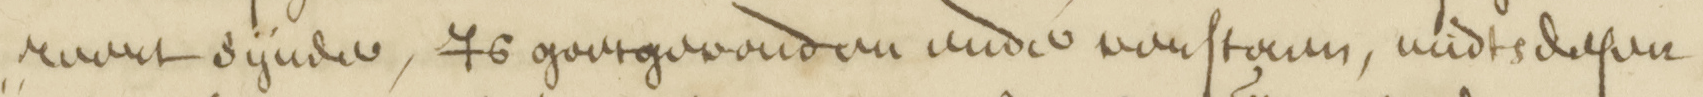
,,reert sijnde, Is goetgevonden ende verstaen, midtsdesen
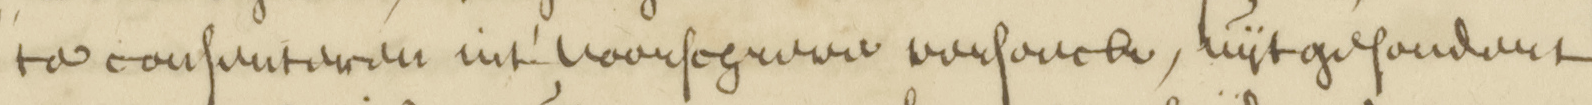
te consenteren int' voorschreve versoeck, uijtgesondert
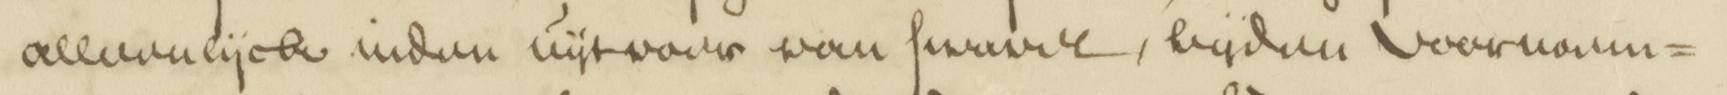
alleenlijck inden uijtvoer van swavel, bijden voernoem=
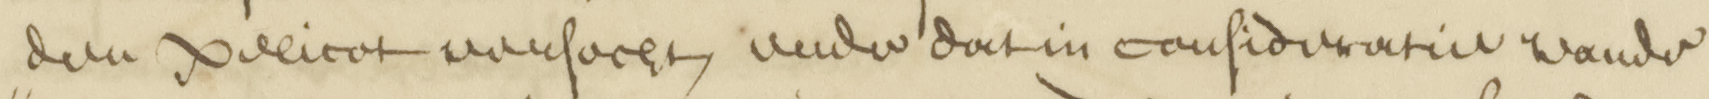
den Pelicot versocht, ende dat in consideratie vande
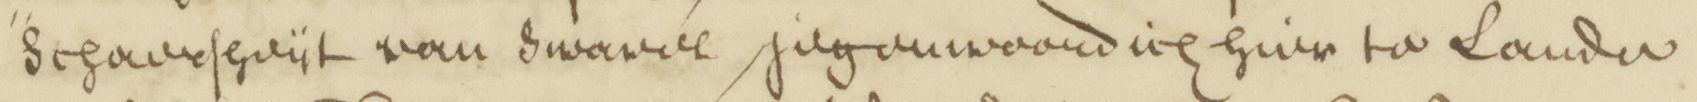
schaersheijt van swavel jegenwoordich hier te Lande
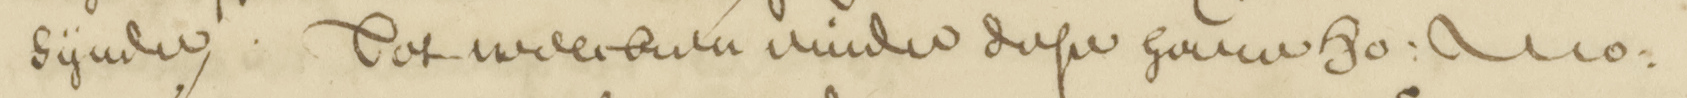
sijnde. Tot welcken ende dese hare Ho:Mo:
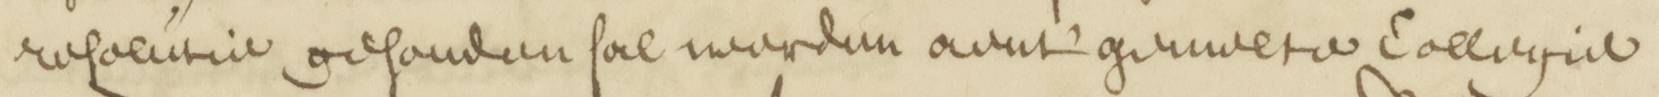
resolutie gesonden sal werden aent' gemelte Collegie
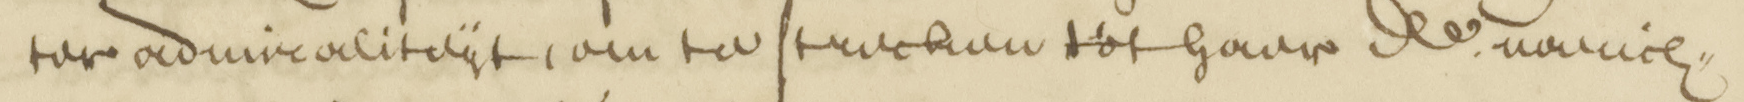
ter admiraliteijt, om te strecken tot haer E. narich„
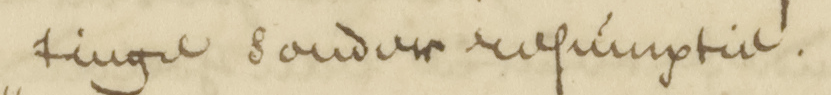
,,tinge sonder resumptie.
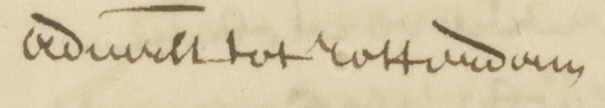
Admrlt tot Rotterdam
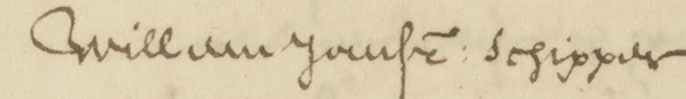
Willem Jansz: Schipper
